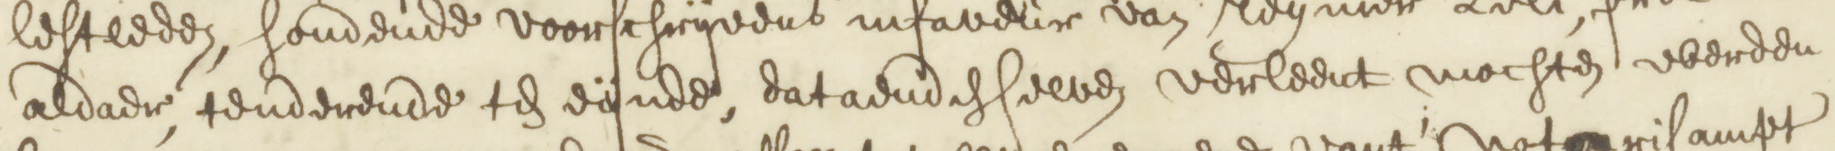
aldaer, tenderende ten eijnde, dat aen denselven verleent mochten werden
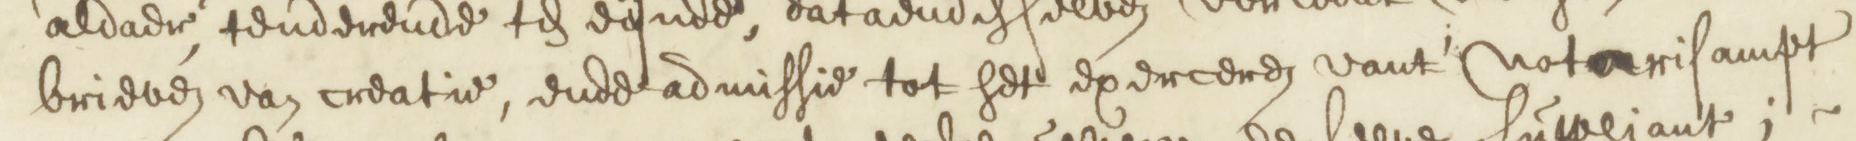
brieven van creatie, ende admissie tot het exerceren vant‛ notarisampt
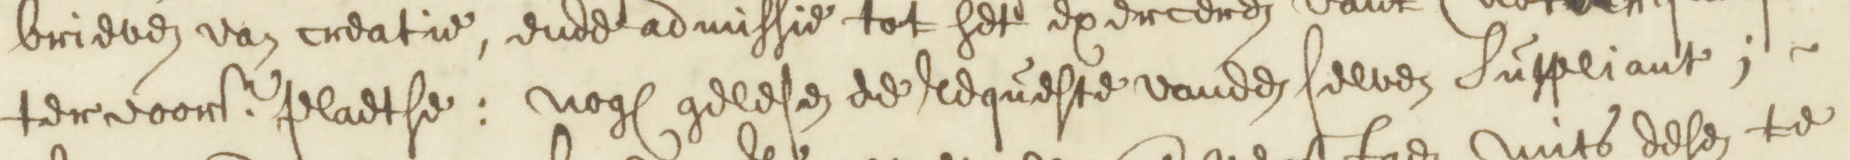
ter voors. plaetse: nogh gelesen de Requeste vanden selven Suppliant;
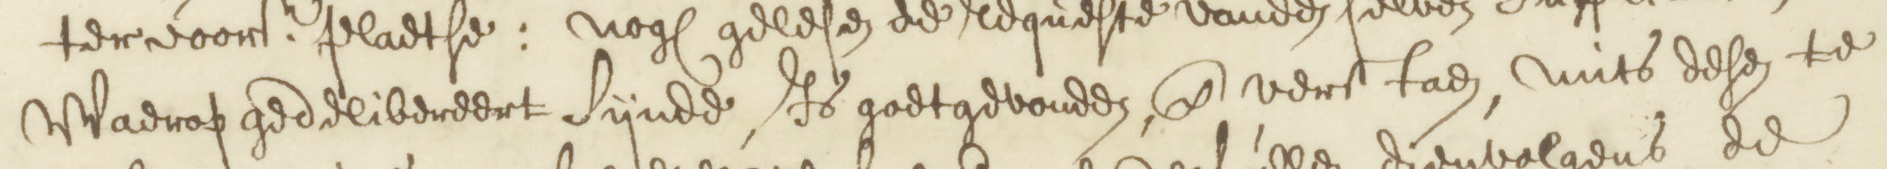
Waerop gedelibereert sijnde, Is goetgevonden, & verstaen, mits desen te
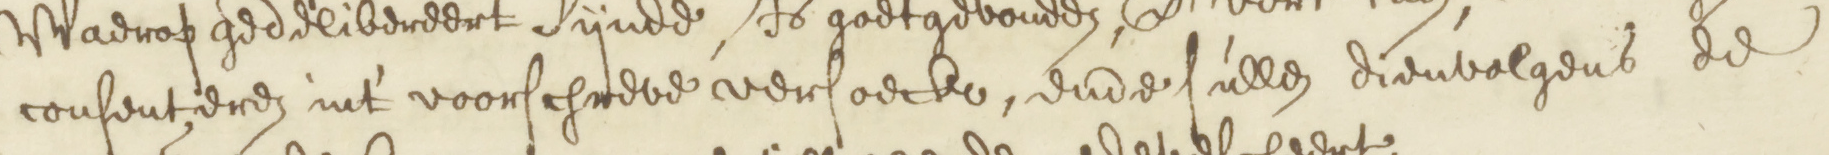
consenteren int‛ voorschreve versoeck, ende sullen dienvolgens de
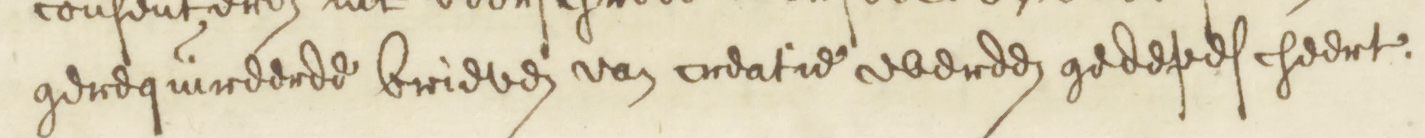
gerequireerde brieven van creatie werden gedepescheert;
